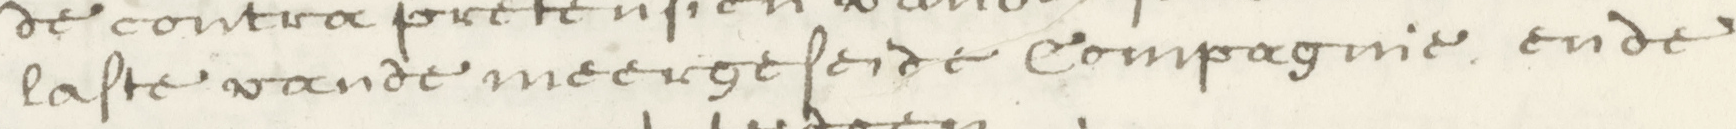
laste vande meergeseide Compagnie, ende
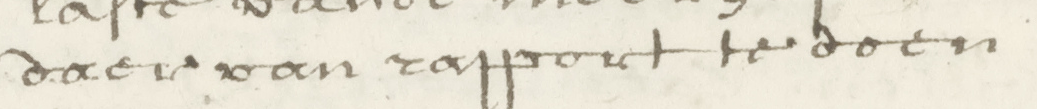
daer van rapport te doen
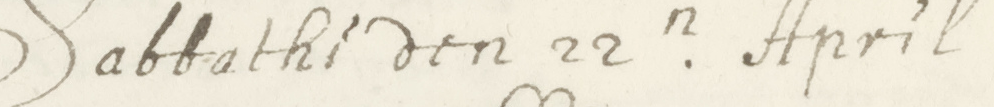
Sabbathi den 22n. April
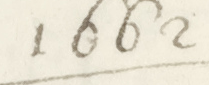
1662
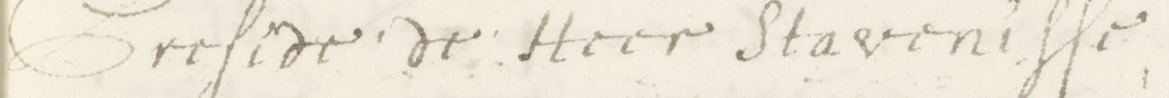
Preside de Heer Stavenisse,
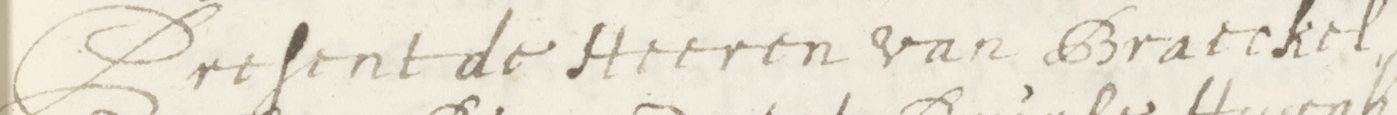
Present de Heeren van Braeckel,
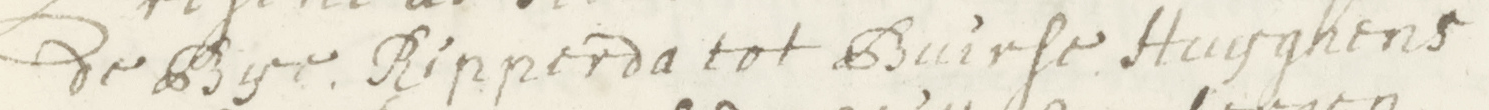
de Bye, Ripperda tot Buirse Huyghens
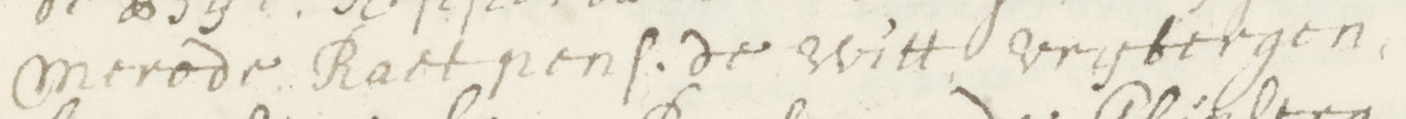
Merode, Raetpens. de witt, vrijbergen,
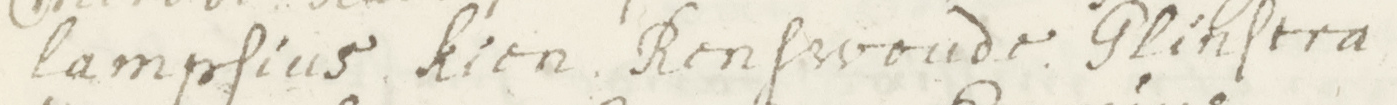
lampsius, kien, Renswoude, Glinstra
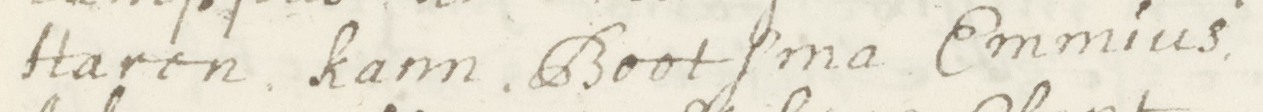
Haren, kann, Bootsma, Emmius,
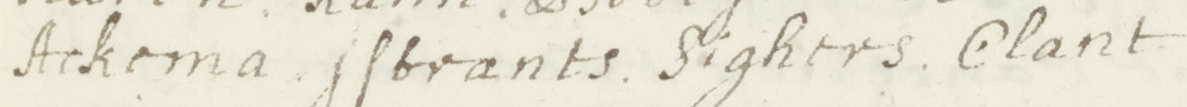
Ackema, isbrants, Sighers, Clant.
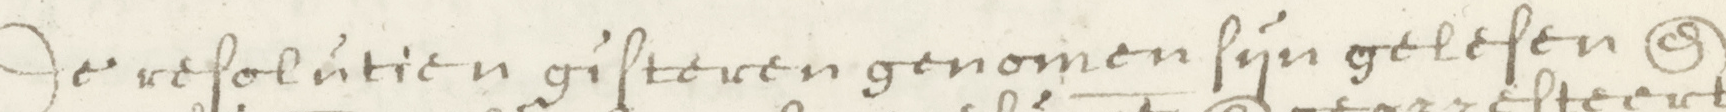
De resolutien gisteren genomen sijn gelesen &
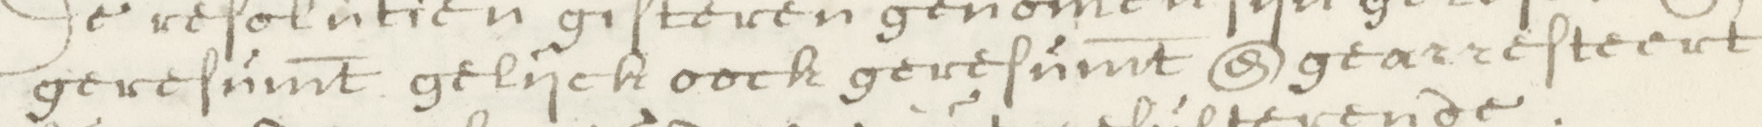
geresumt gelijck oock geresumt & gearresteert
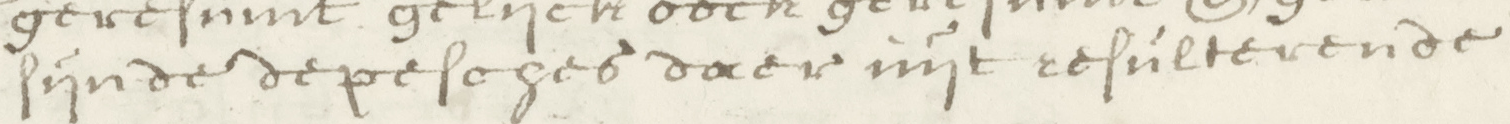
sijn de depesches daer uijt resulterende
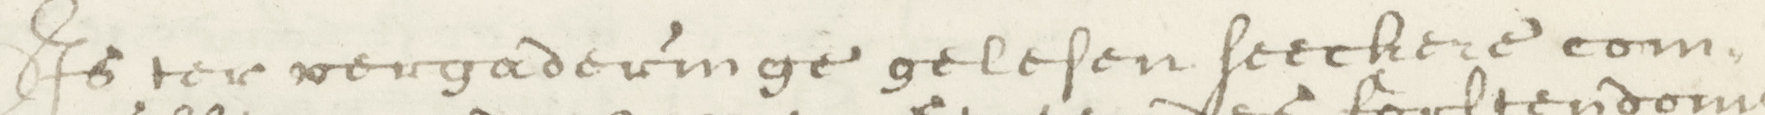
Is ter vergaderinge gelesen seeckere com,,
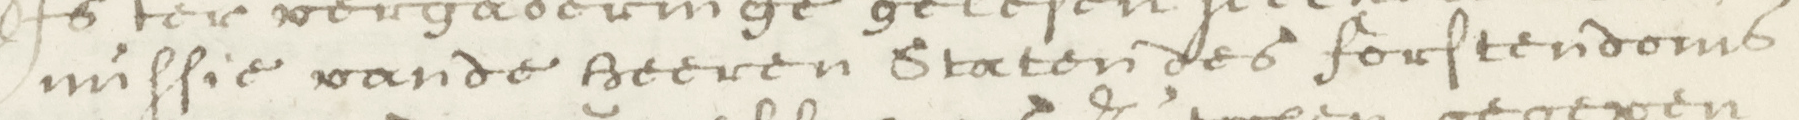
missie van de heeren Staten des forstendoms
